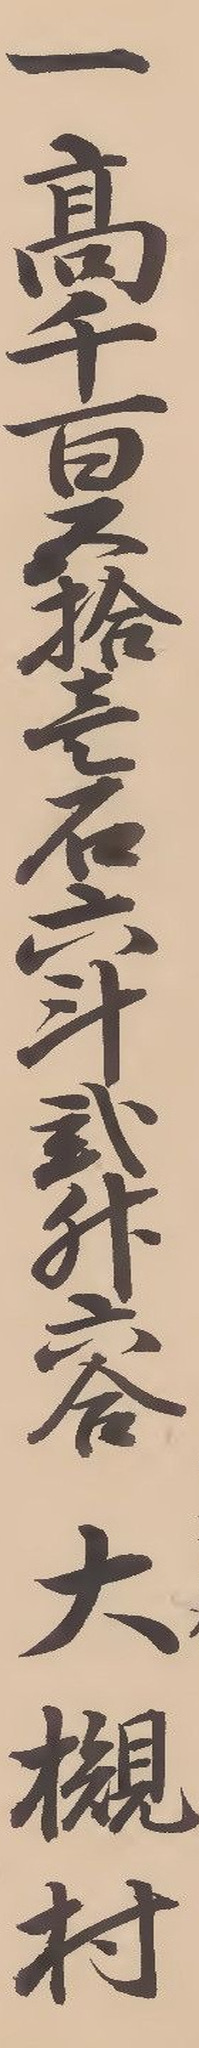一高千百五拾壱石六斗弐升六合大槻村
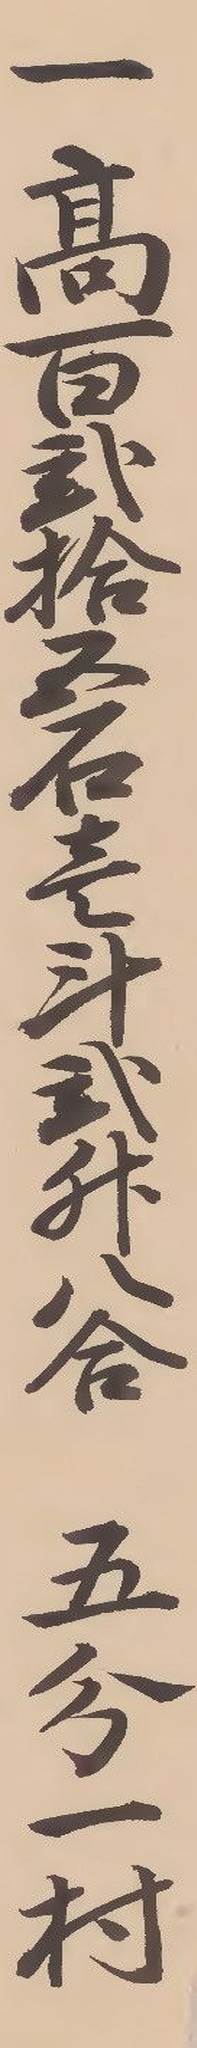一高百弐拾五石壱斗弐升八合五分一村
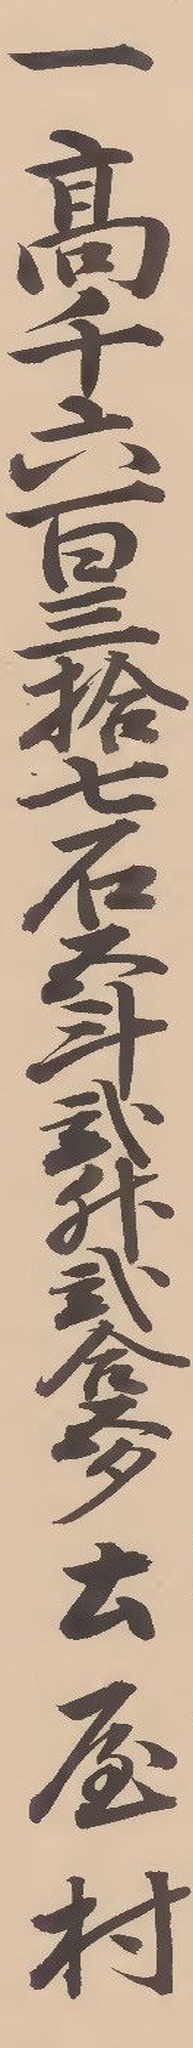一高千六百三拾七石五斗弐升弐合五勺土屋村
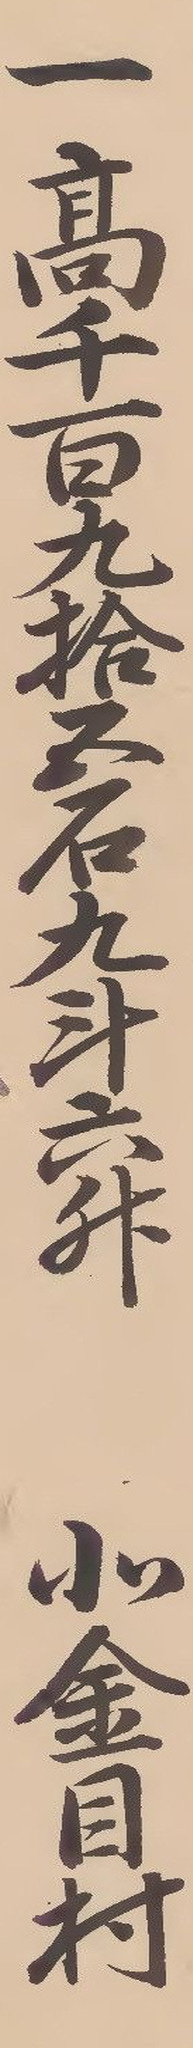一高千百九拾五石九斗六升北金目村

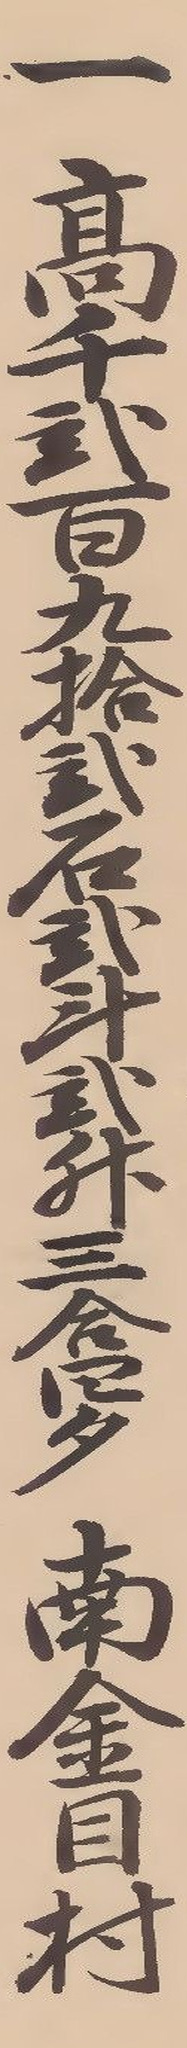一高千弐百九拾弐石弐斗弐升三合四勺南金目村
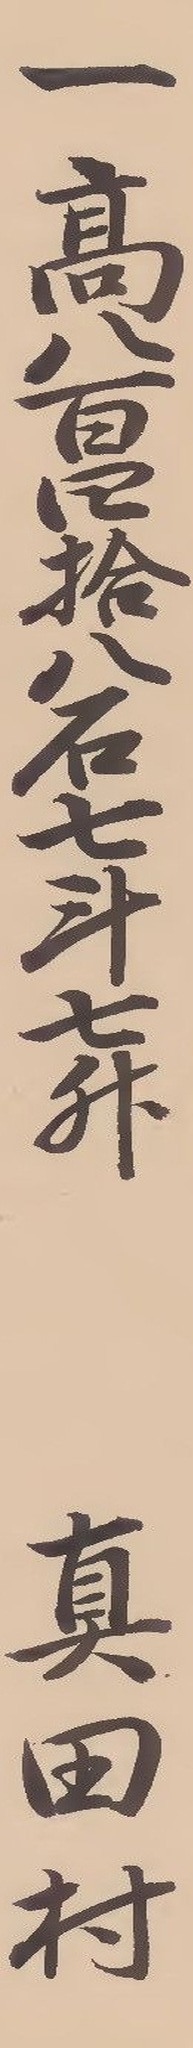一高八百四拾八石七斗七升真田村
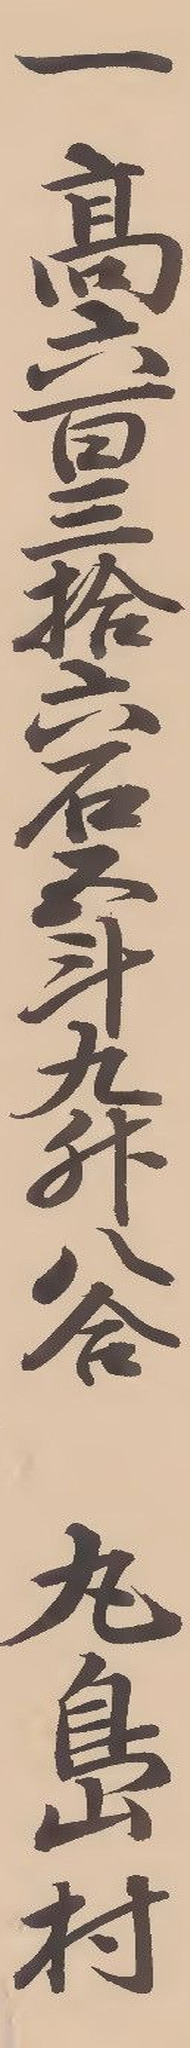一高六百三拾六石五斗九升八合丸島村
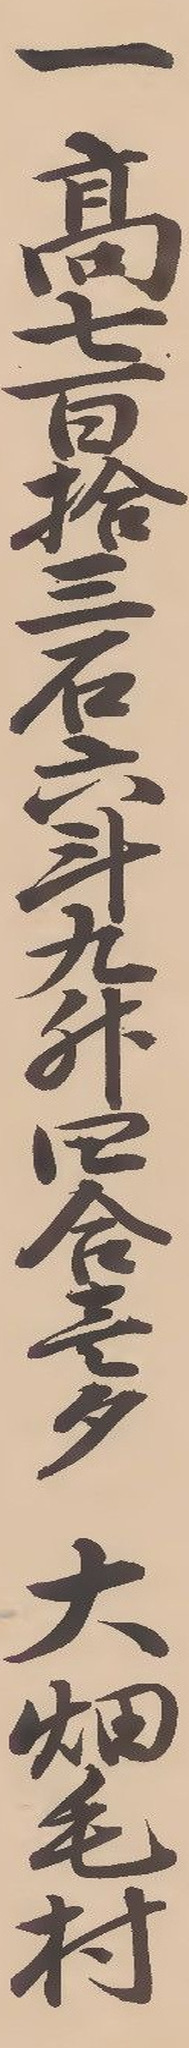一高七百拾三石六斗九升四合壱勺大畑毛村
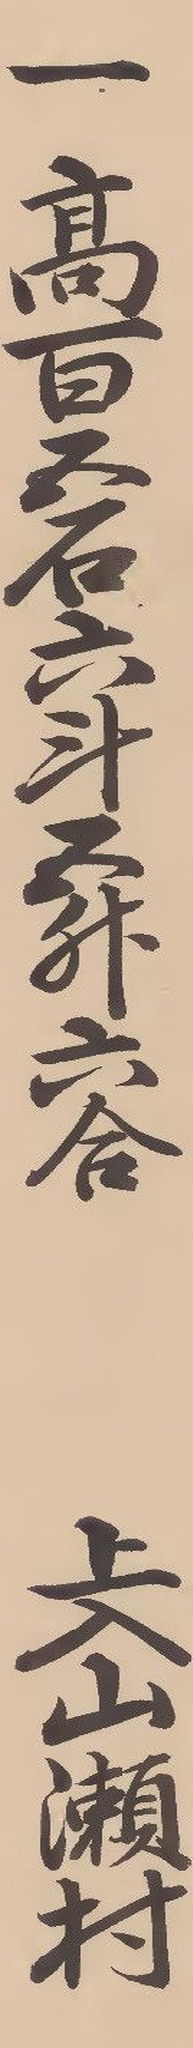一高百五石六斗五升六合上入山瀬村
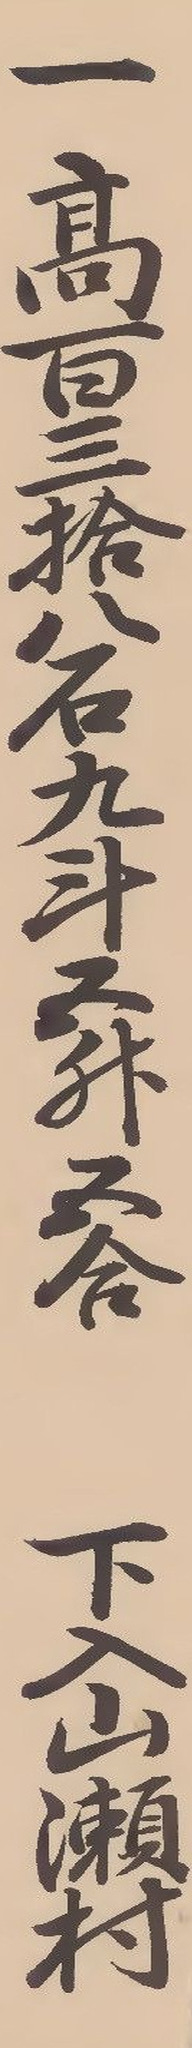一高百三拾八石九斗五升五合下入山瀬村
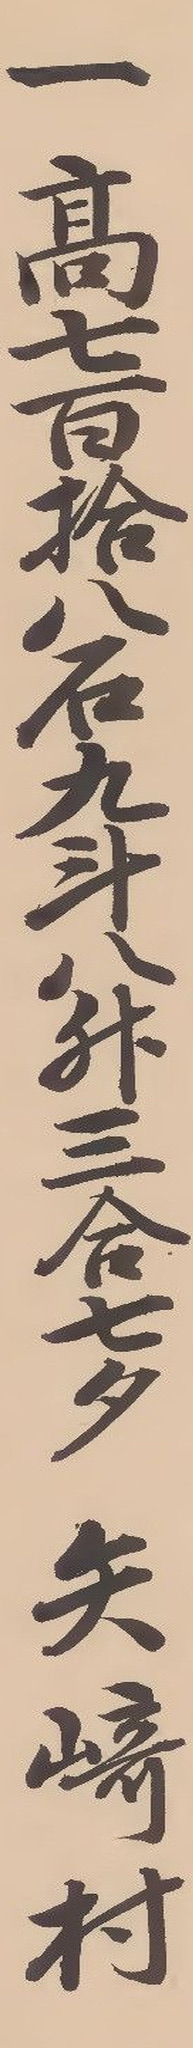一高七百拾八石九斗八升三合七勺矢崎村
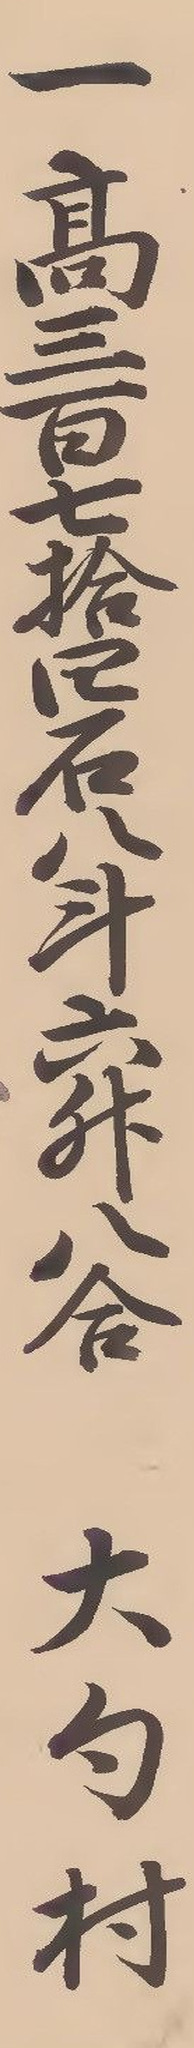一高三百七拾四石八斗六升八合大句村

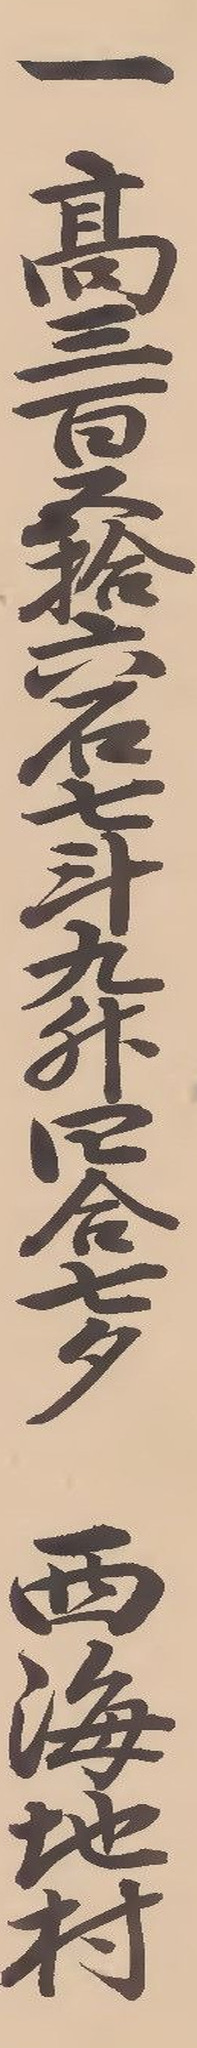一高三百五拾六石七斗九升四合七勺西海地村
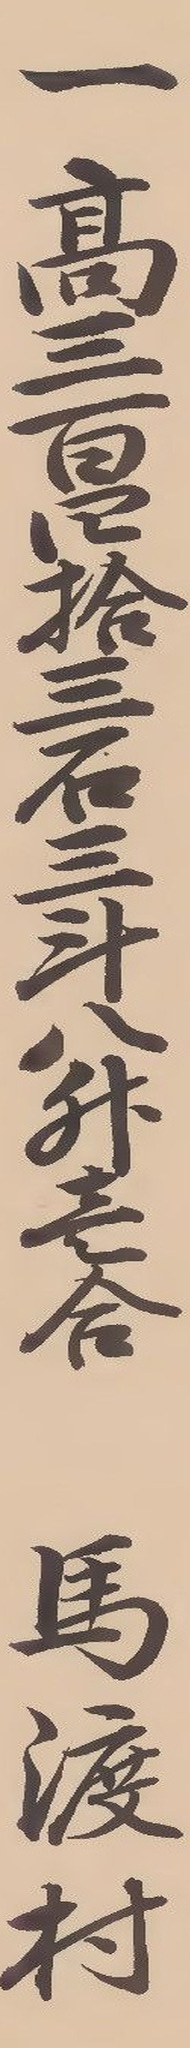一高三百四拾三石三斗八升壱合馬渡村
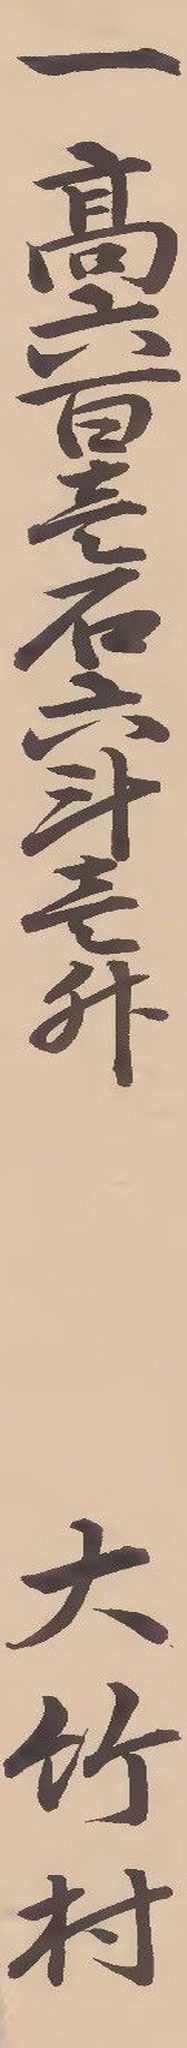一高六百壱石六斗壱升大竹村
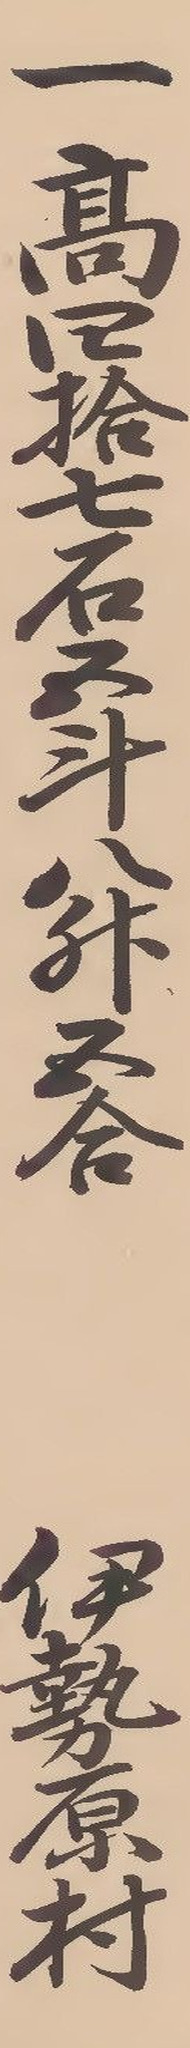一高四拾七石五斗八升五合伊勢原村
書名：相模国郷帳
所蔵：国立公文書館 National Archives of Japan
